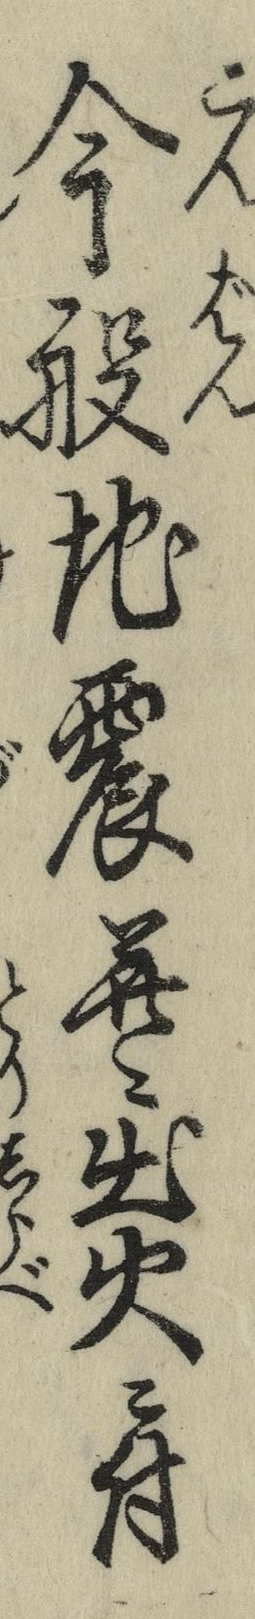今般地震并ニ出火ニ付
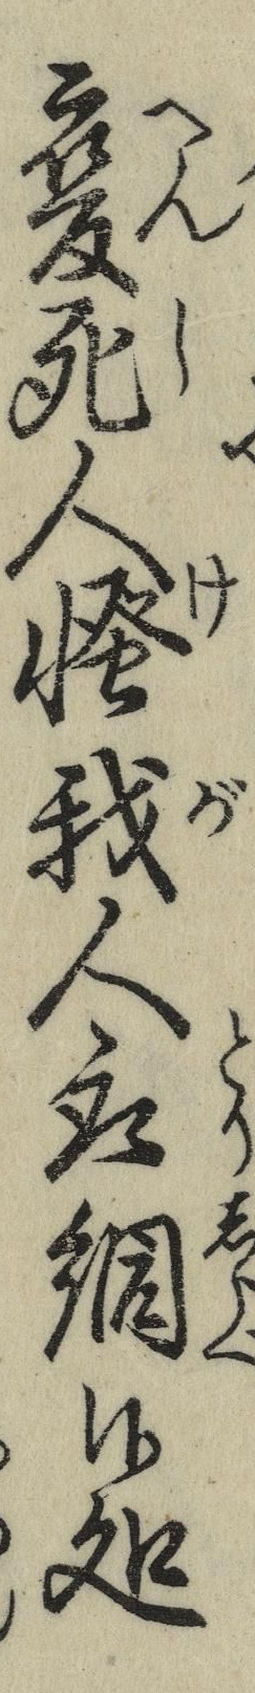変死人怪我人取調候処
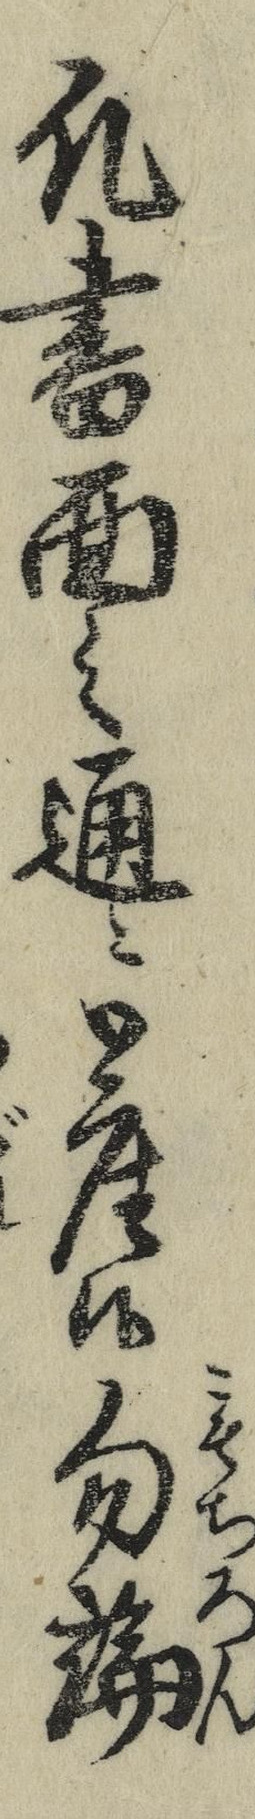凡書面之通ニ御座候勿論
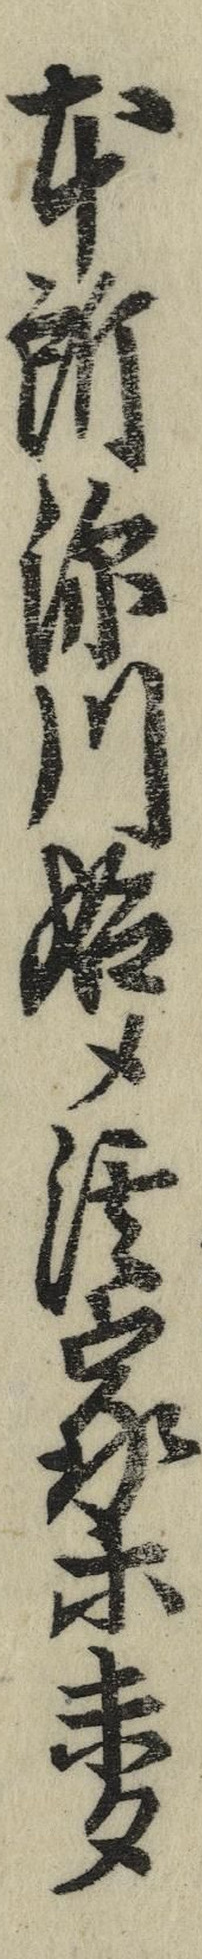本所深川始メ潰家等未タ
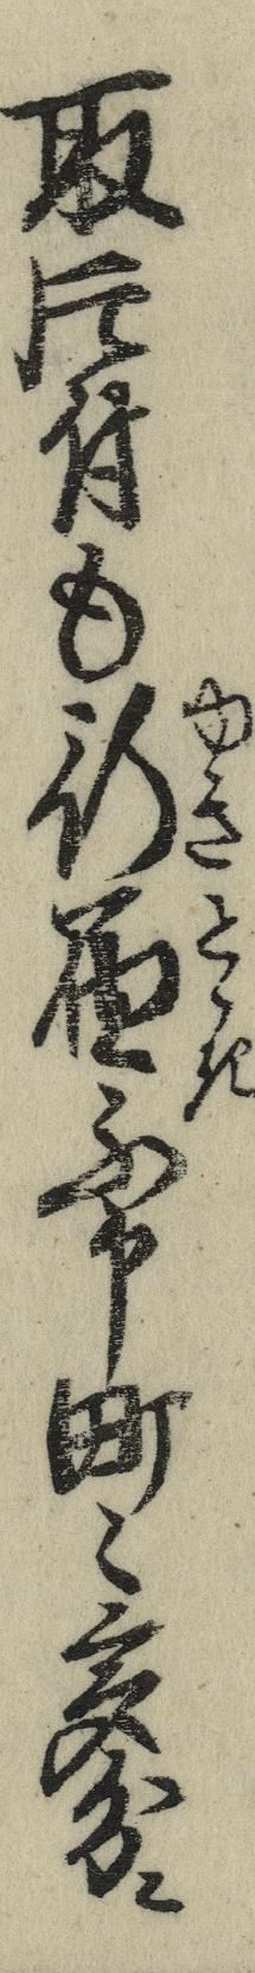取片付も行届不申町々多分ニ
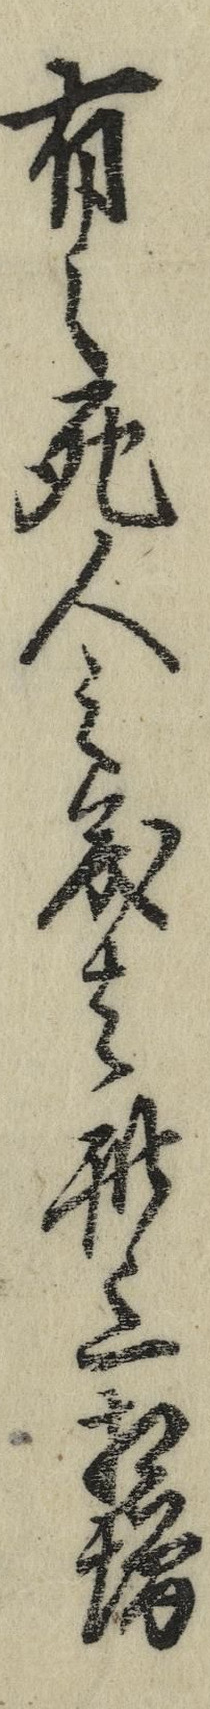有之死人之義は此上相増
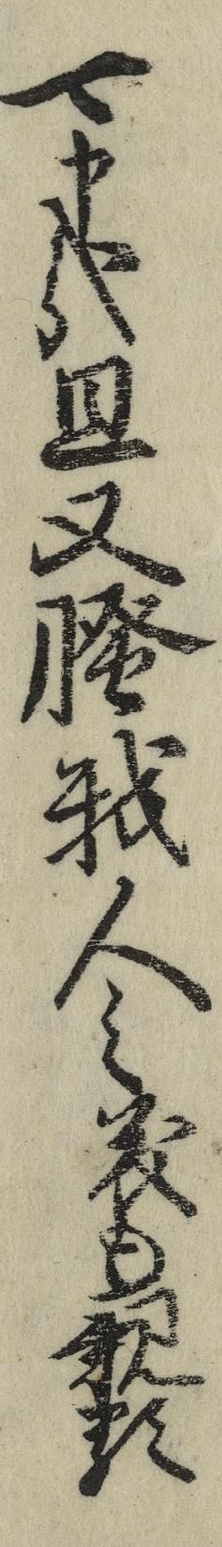可申哉旦又怪我人の義も親類
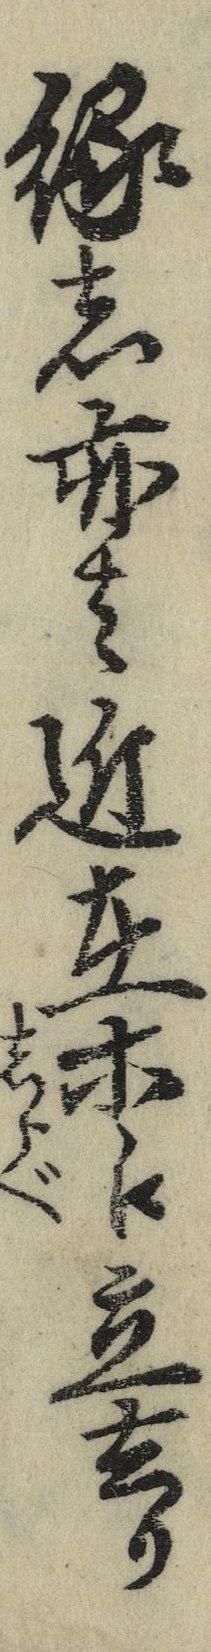縁者亦は近在等え立去り
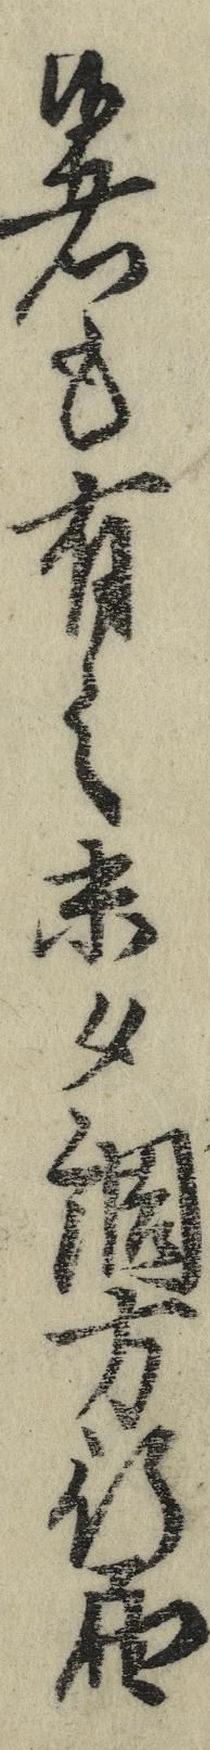候者も有之未タ調方行届
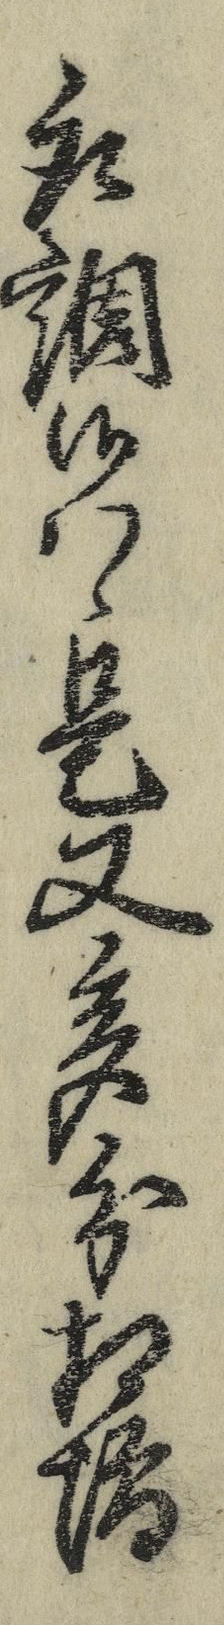取調候はゝ是又多分相増
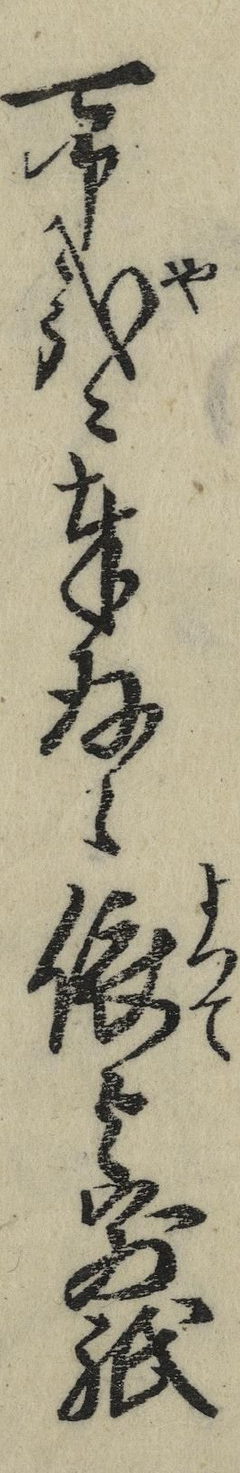可申哉と奉存候依其別紙
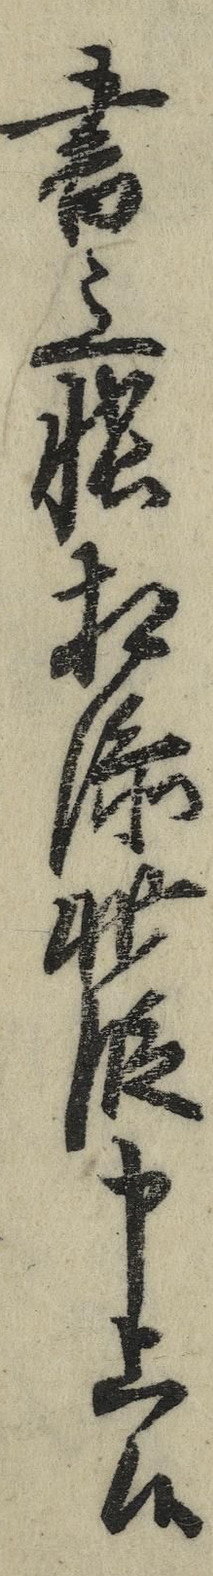書上帳相添此段申上候

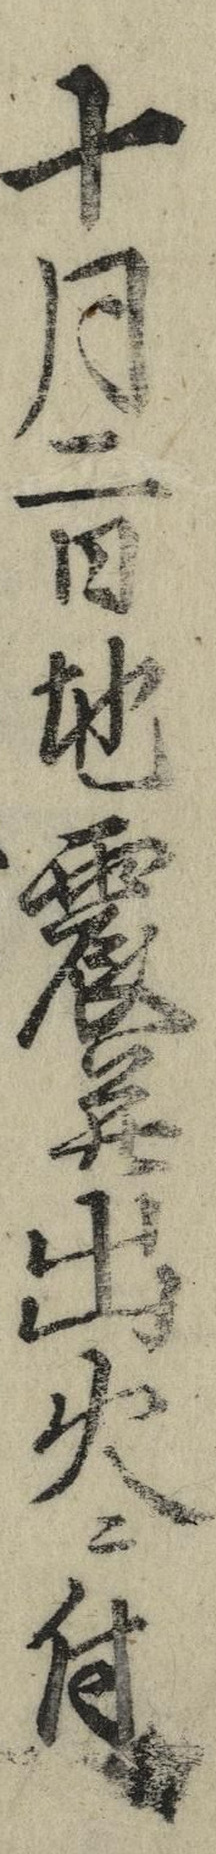十月二日地震并出火ニ付
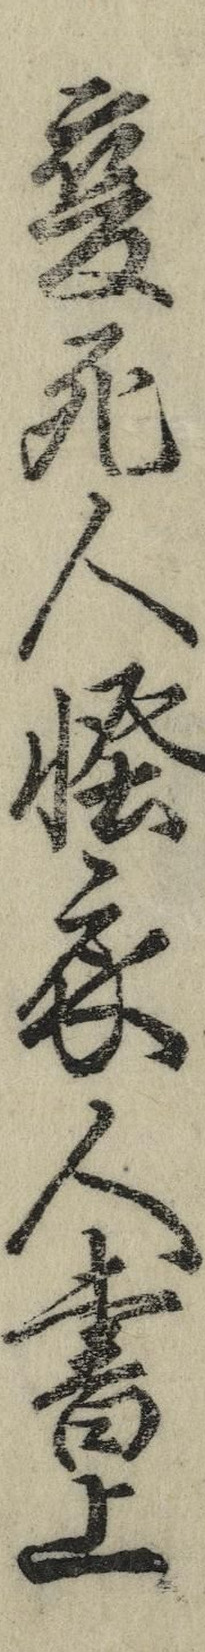変死人怪我人書上
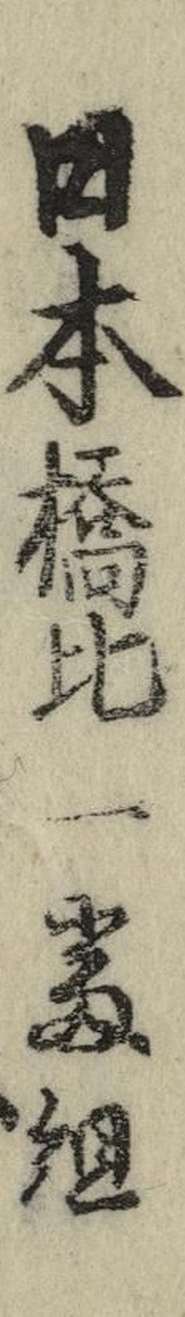日本橋北一番組
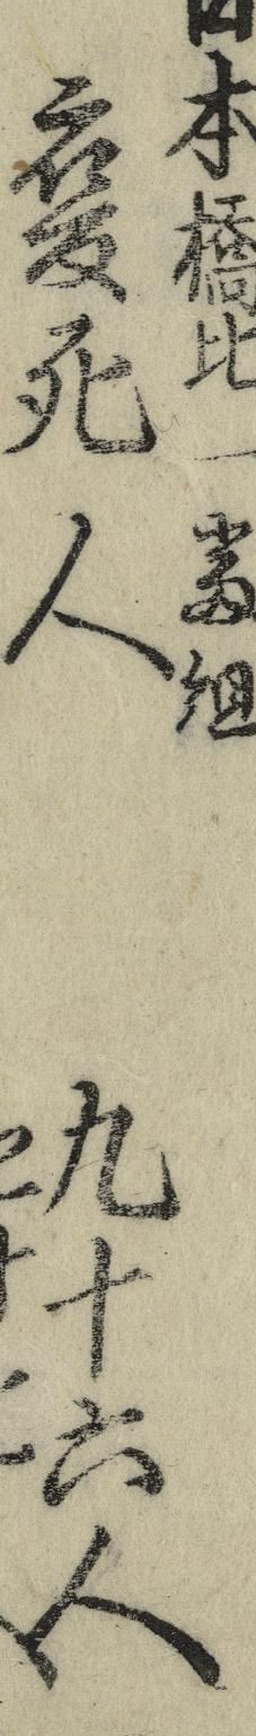変死人九十六人
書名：地震出火　男女死人怪我人書上之冩
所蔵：東京大学地震研究所図書室 Earthquake Research Institute Library, The University of Tokyo, JAPAN
